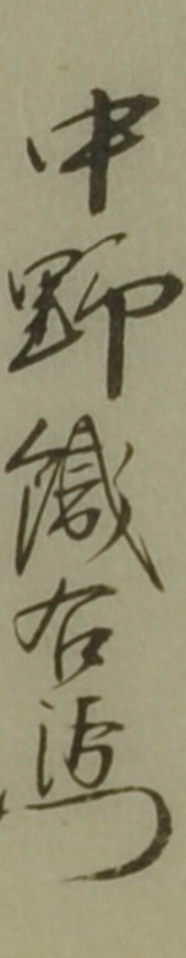中野織右衛門
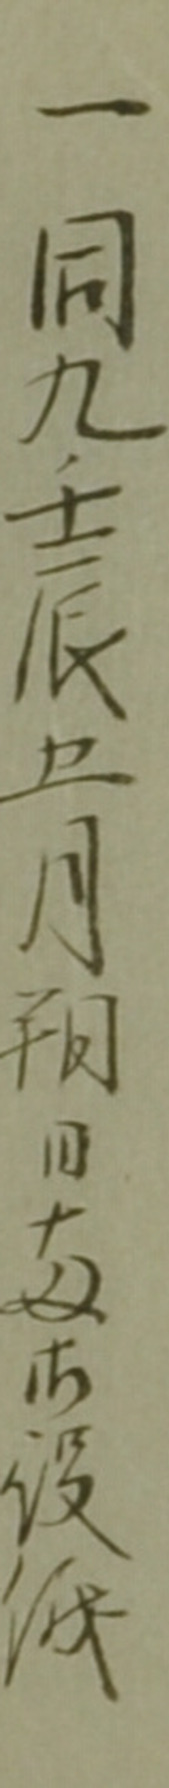一同九壬辰五月朔日両御役儀
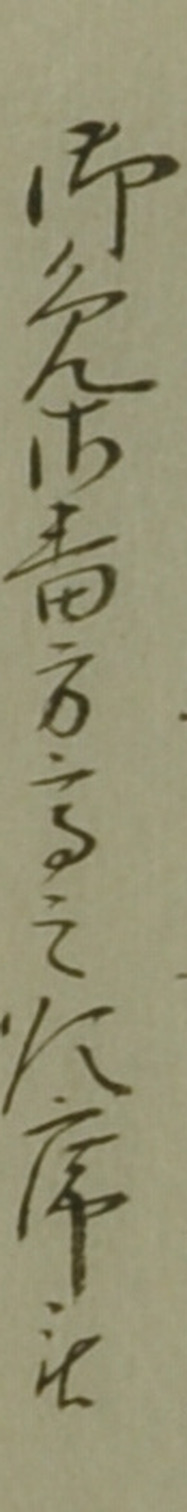御免御番方高之順席被
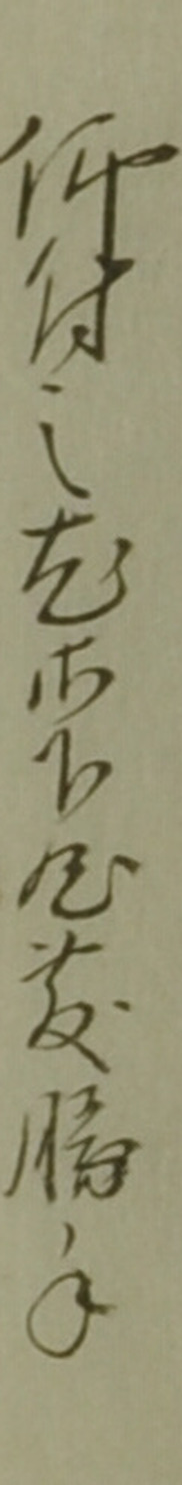仰付之尤御下屋敷勝手
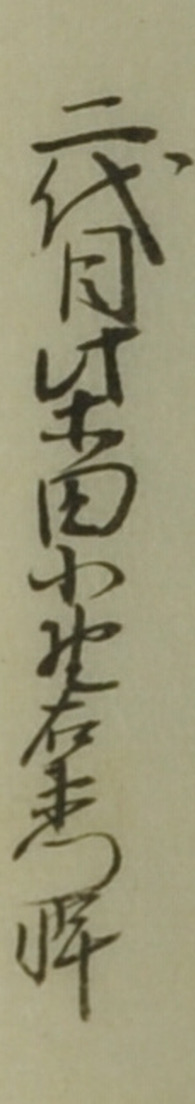二代目柴田小野右衛門忰

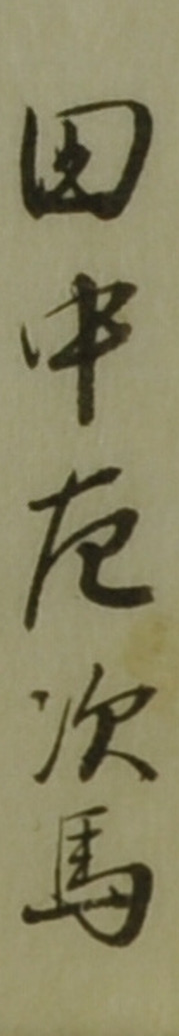田中左次馬
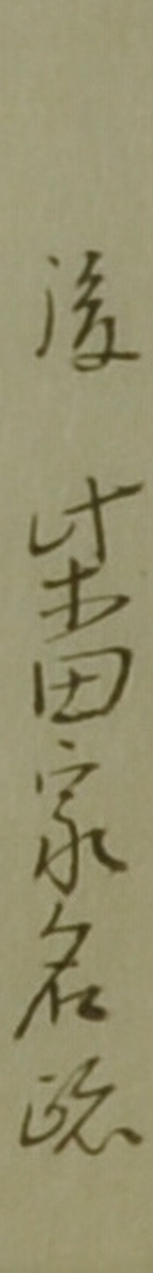後柴田家名跡
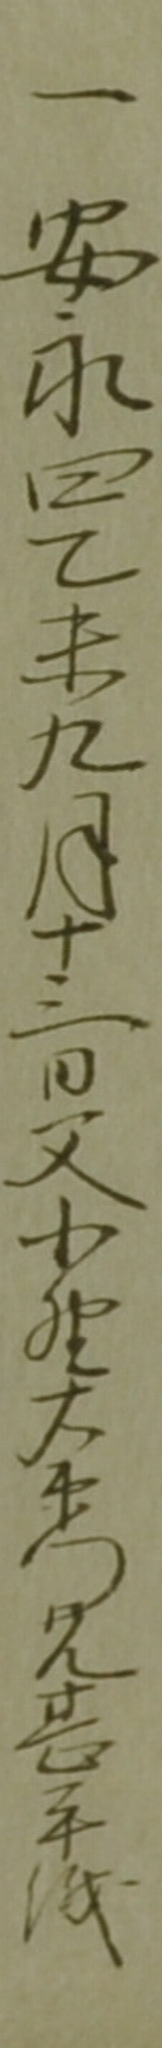一安永四乙未九月十三日父小野右衛門兄甚平儀
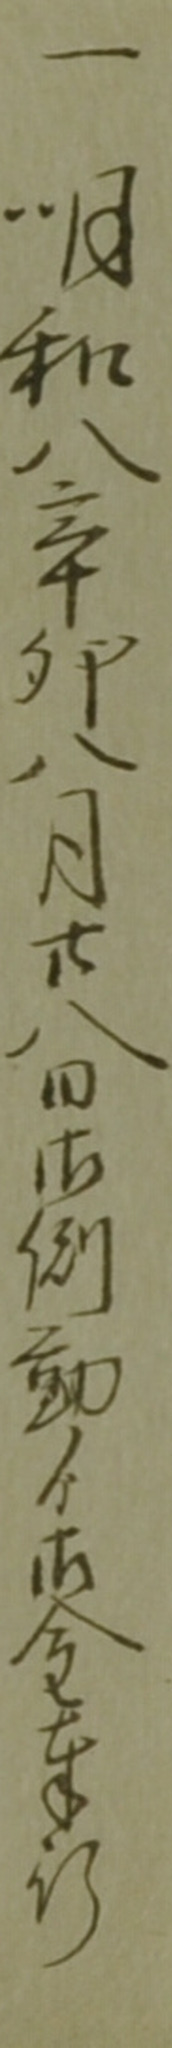一明和八辛卯八月廿八日御側勤ゟ御金奉行
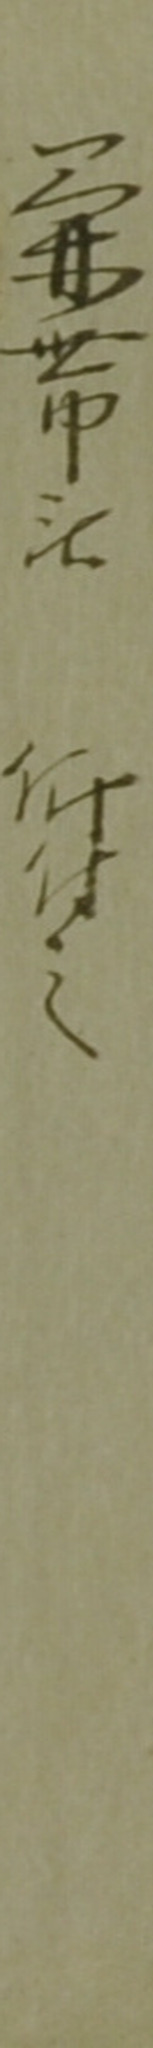兼帯被仰付之
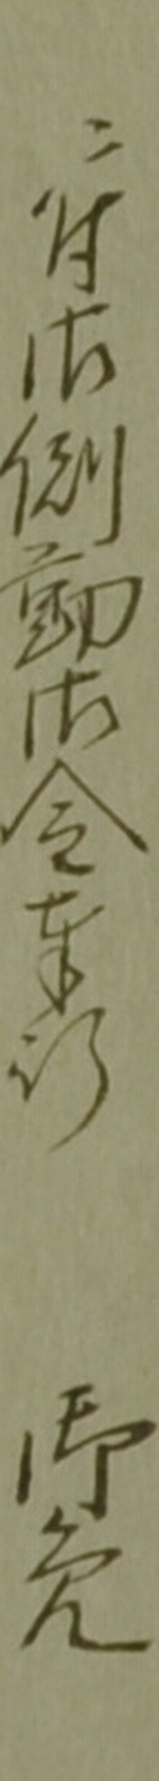ニ付御側勤御金奉行御免
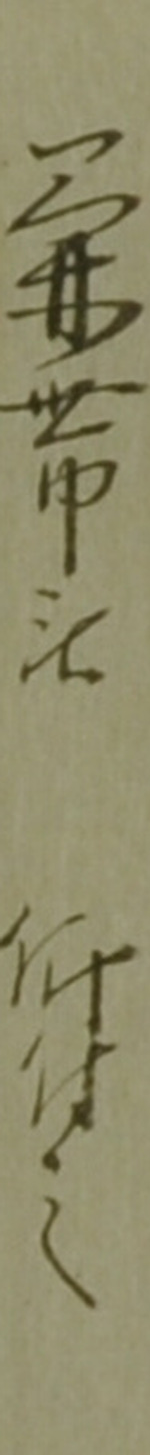兼帯被仰付之
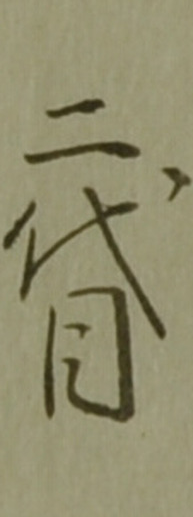二代目
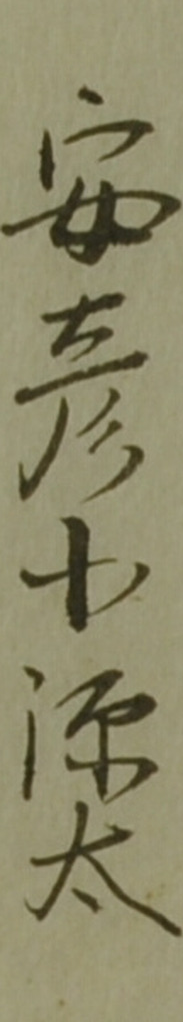安彦小源太
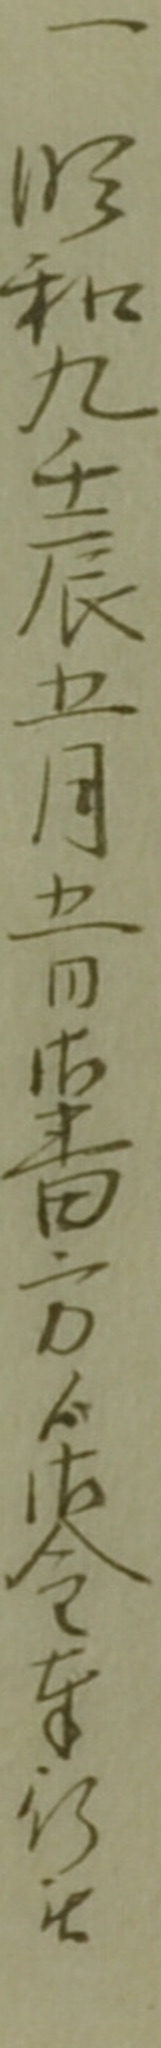一明和九壬辰五月五日御番方ゟ御金奉行被
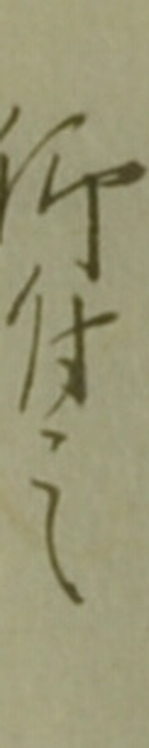仰付之
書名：諸御役代々録（七）
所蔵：伊那市立高遠町図書館・合同会社AMANE
